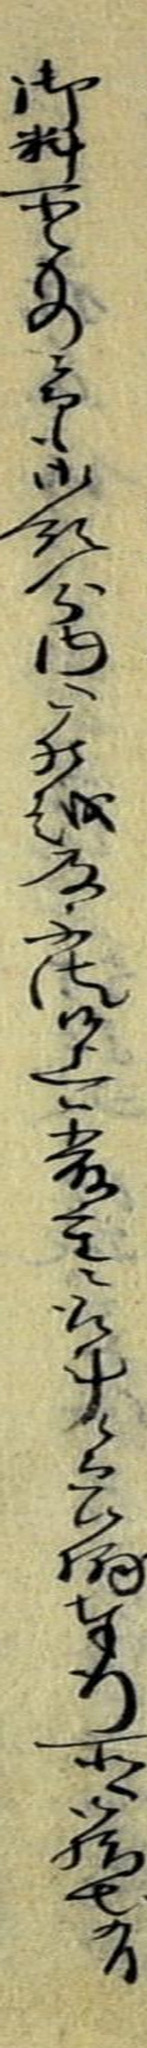御料所之ものに而も御領分内へ罷越及不法候上は厳重に取斗候而召捕奉行所へ御指出有
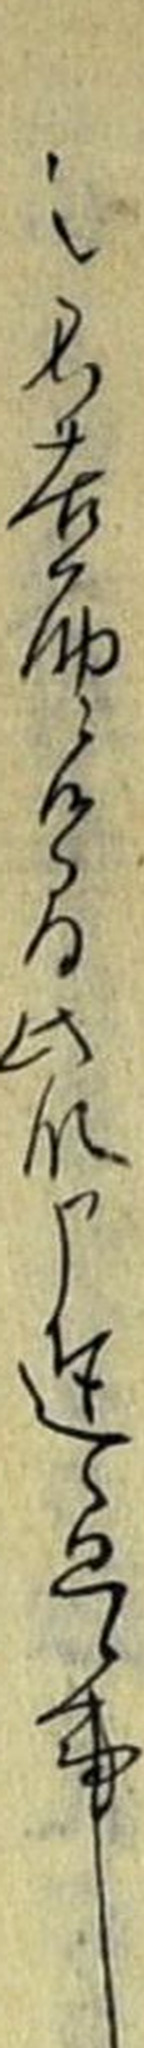之不苦筋に候間此段申達置候事
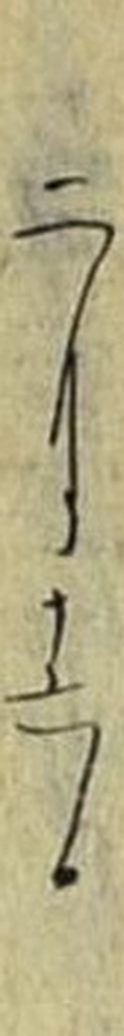二月十六日
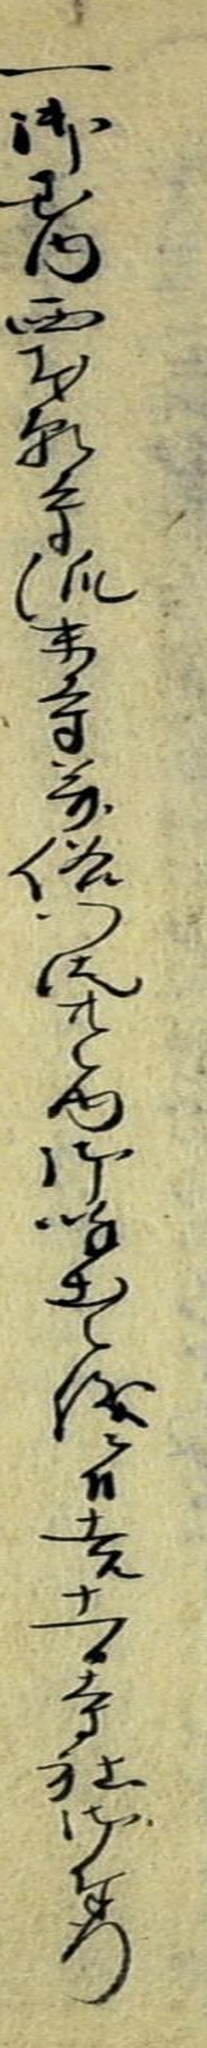一御国内西本願寺派末寺并俗門徒共之内御呼出之儀に付去ル十一日寺社御奉行
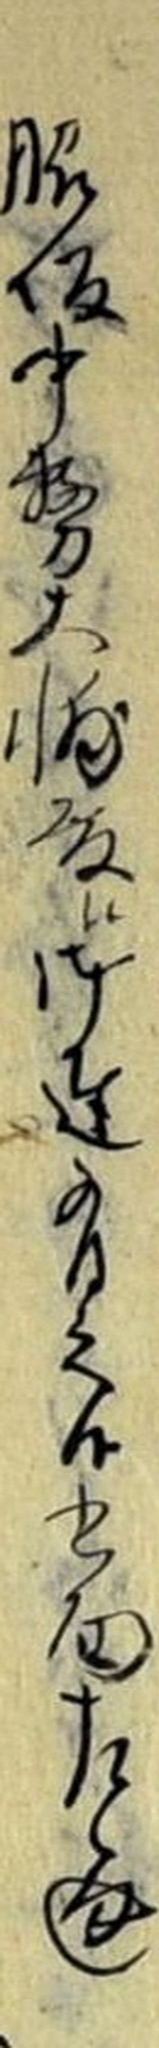脇坂中務太輔殿江御達有之候書面左之通
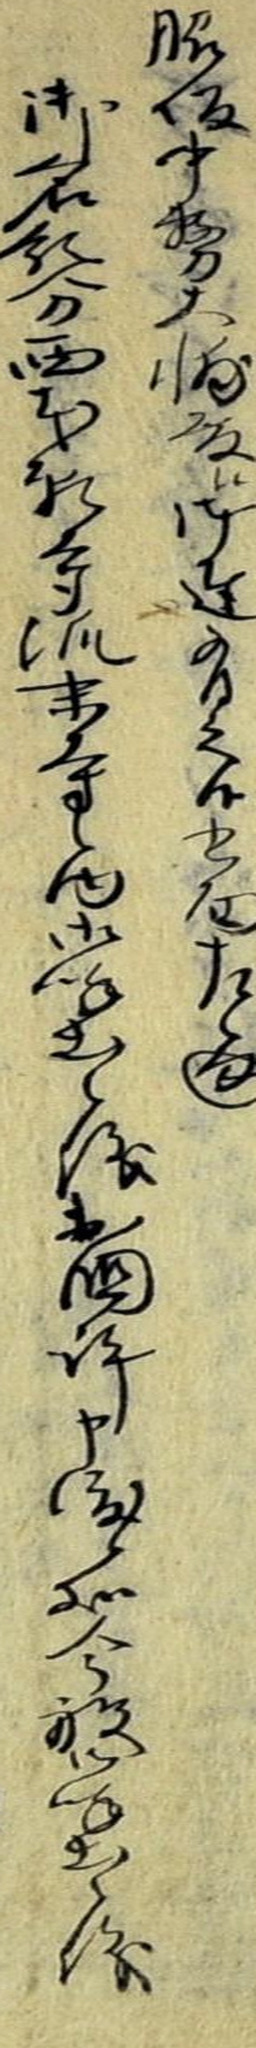御名領分西本願寺派末寺之内御呼出候儀於国許申渡候処今般御呼出之儀
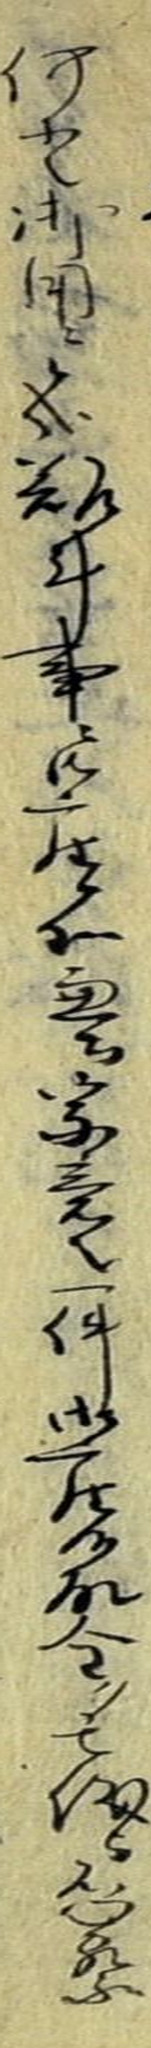何等之御用に候哉難斗事に御座候処兼而宗意之一件御座候故全ク其儀と厚察
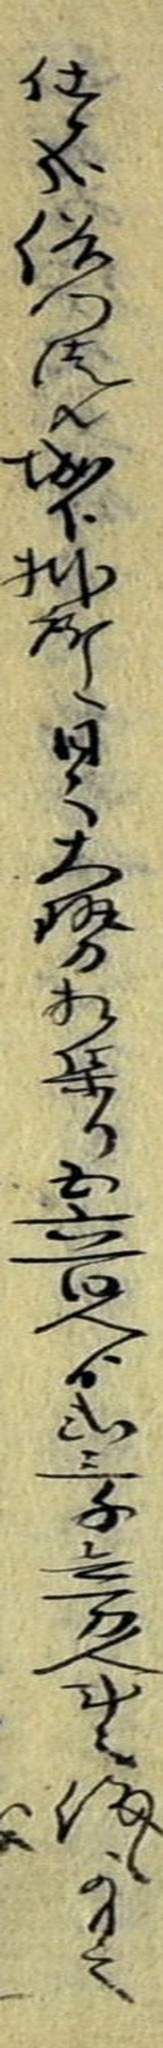仕候哉俗門徒共城下掛所へ日々大勢相集り五六百人ゟ弐三千壱万人斗之儀も有之
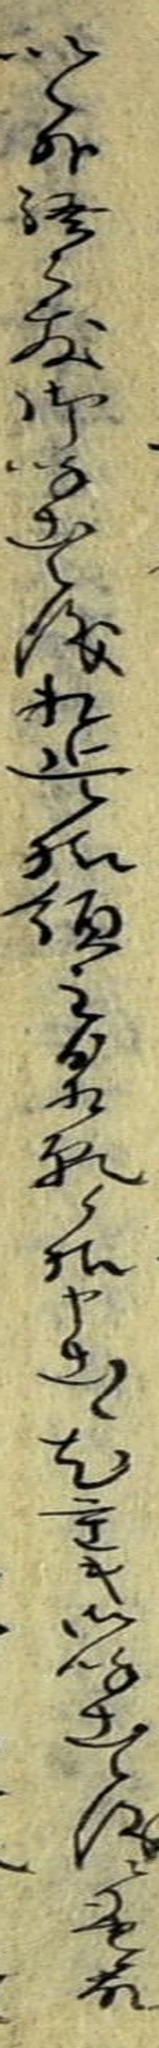以之外騒々敷御呼出之儀相止候様領主ゟ相願候様申出候尤重キ御呼出之儀に御座候故
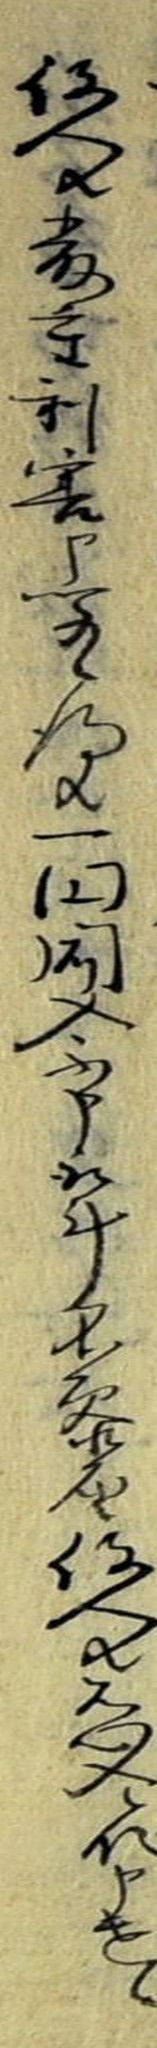役人共厳重利害申聞候得共一円聞入不申取斗不受御座候役人共恐入候段申遣候

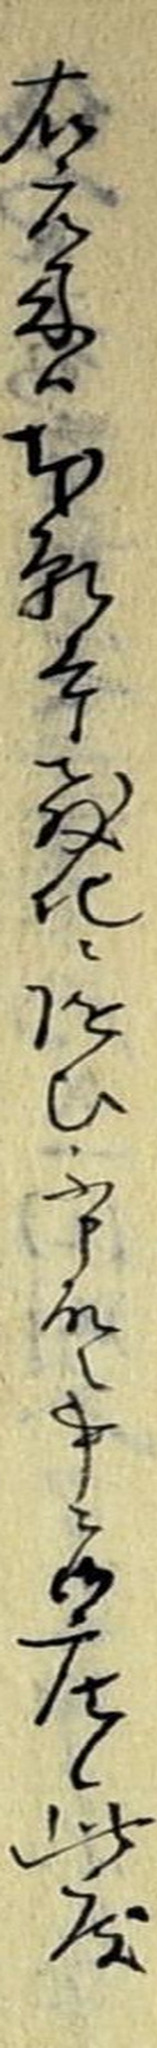右元来は本願寺教化に随ひ不申故之事に御座候此度
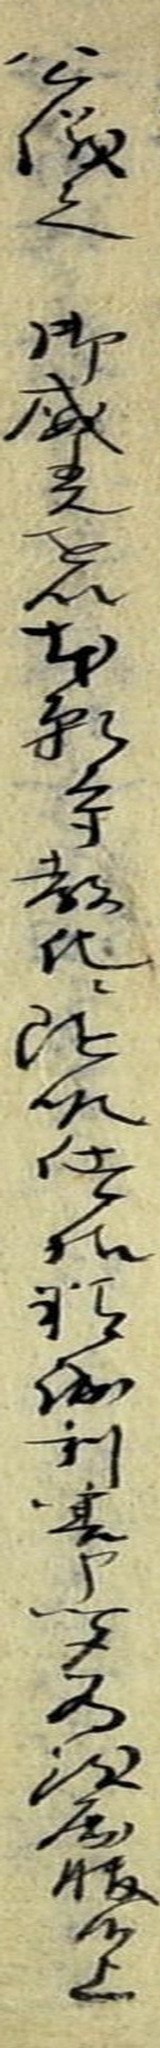公儀之御威光を以本願寺教化に随順仕候様精誠利害申聞為致屈服候上
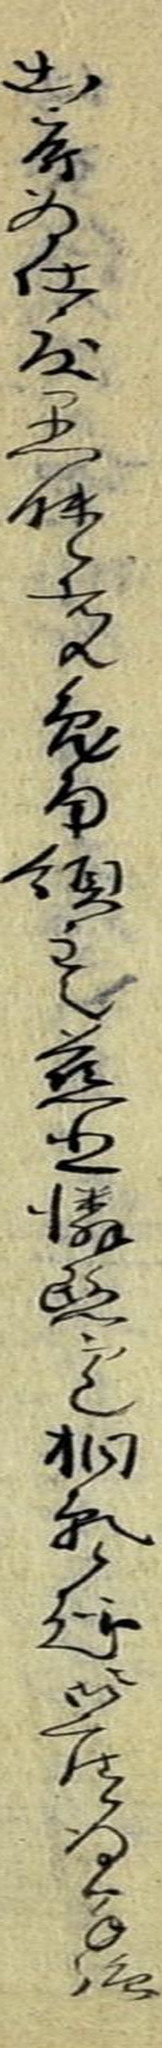出府為仕度愚昧之者共兎角領主之慈悲憐愍而己相願候趣に御座候得は手強
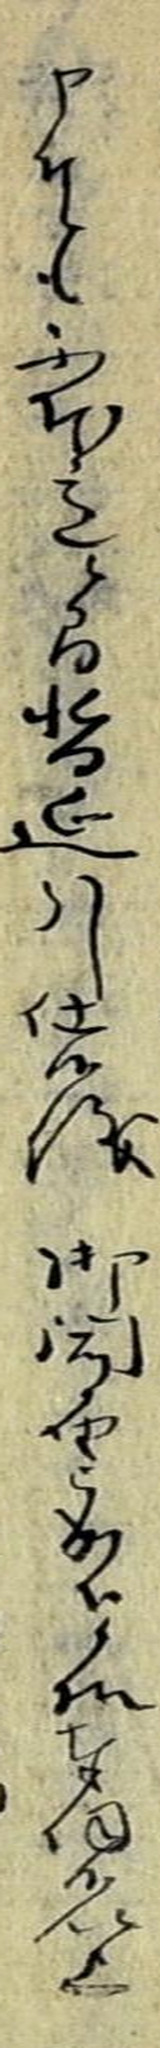申付候も不本意に候間暫延引仕候儀御聞届被成下候様奉伺候以上
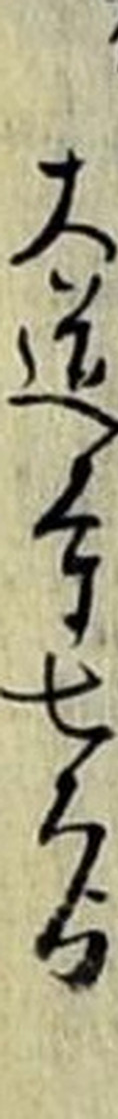大道寺七右衛門
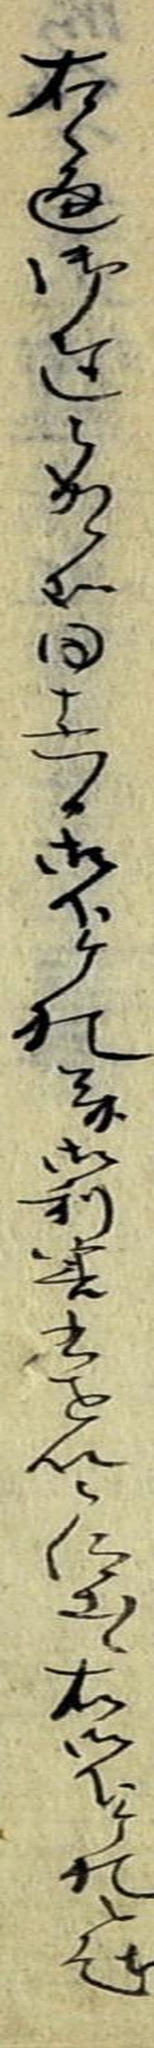右之通御達被成候処同十六日御下ヶ札并御利害書を以被仰出候右御下ヶ札之趣
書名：命令之部 四
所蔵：福井県文書館 Fukui Prefectural Archives
